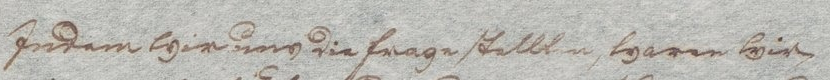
Indem wir uns die Frage stellten, waren wir
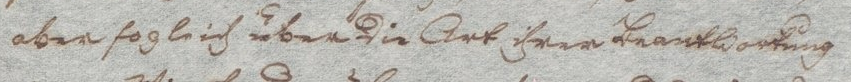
aber sogleich über die Art ihrer Beantwortung
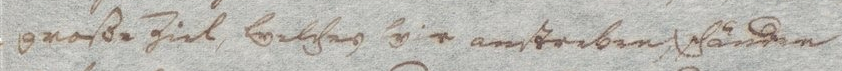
große Ziel, welches wir anstreben, schänden
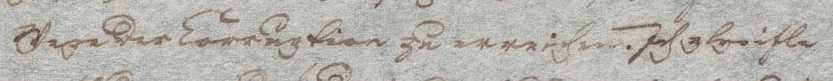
Wege der Corruption zu erreichen. Ich zweifle
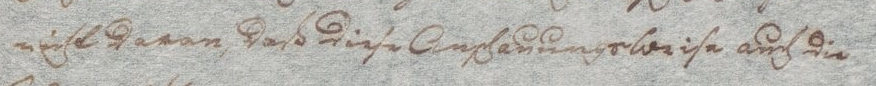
nicht daran, daß diese Anschauungsweise auch die
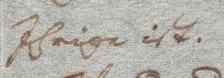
Ihrige ist.
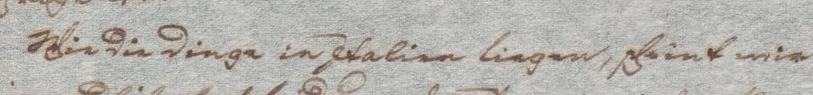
Wie die Dinge in Italien liegen, scheint mir
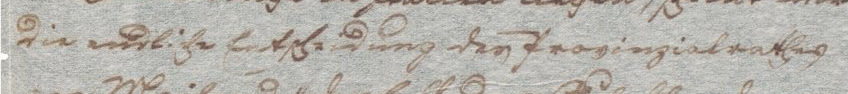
die endliche Entscheidung des Provinzialrathes
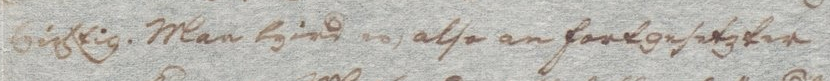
wichtig. Man wird es also an fortgesetzter
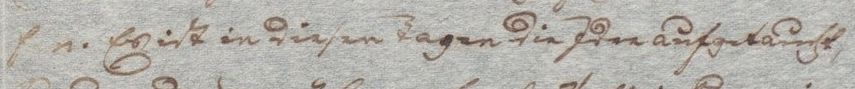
fen. Es ist in diesen Tagen die Idee aufgetaucht,
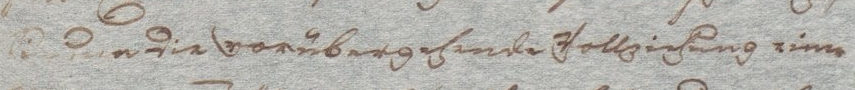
Sie um die vorübergehende Vollziehung einer
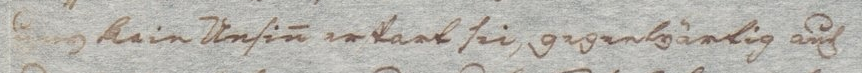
uns kein Unsinn erspart sei, gegenwärtig auch
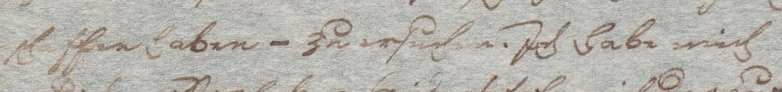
zu schaffen haben – zu ersuchen. Ich habe mich
